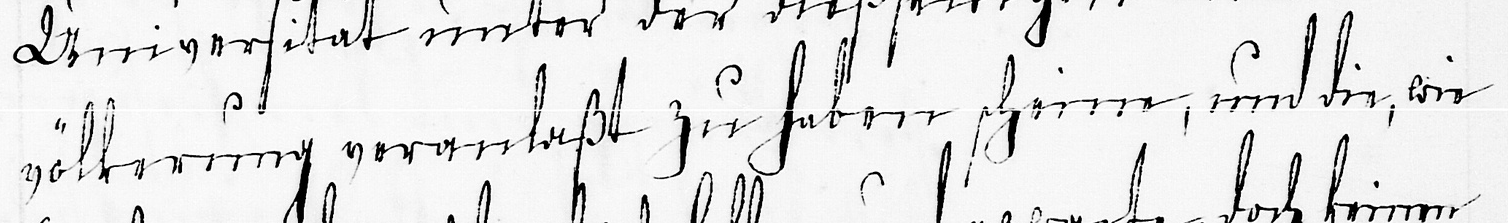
völkerung veranlaßt zu haben scheine, und die, wie
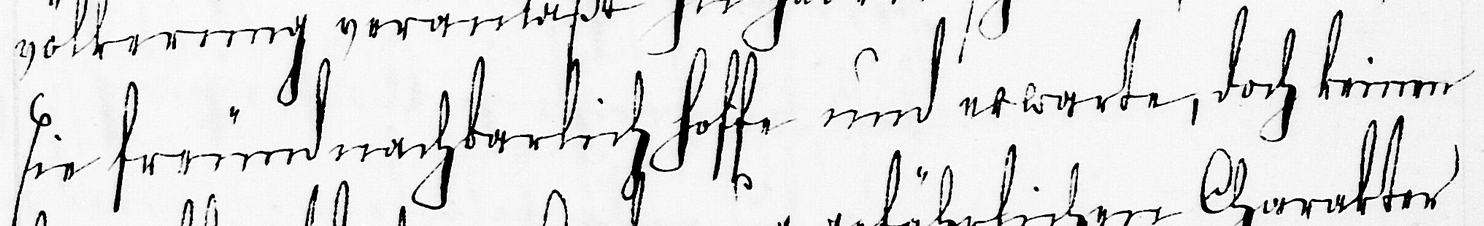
sie freundnachbarlich hoffe und erwarte, doch keinen
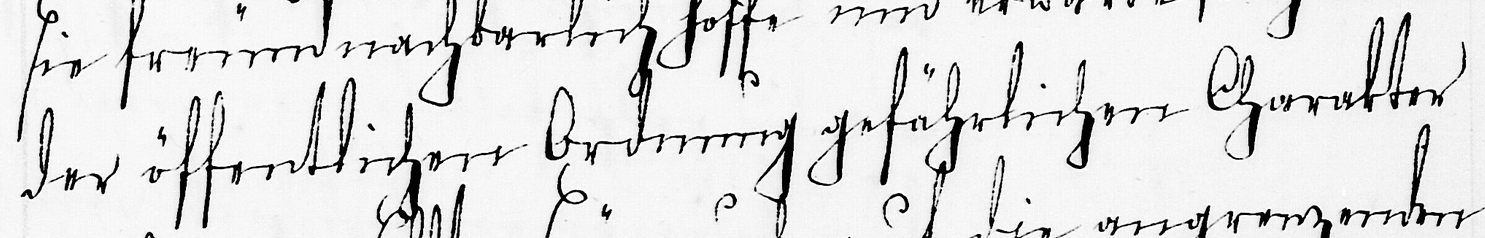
der öffentlichen Ordnung gefährlichen Charakter
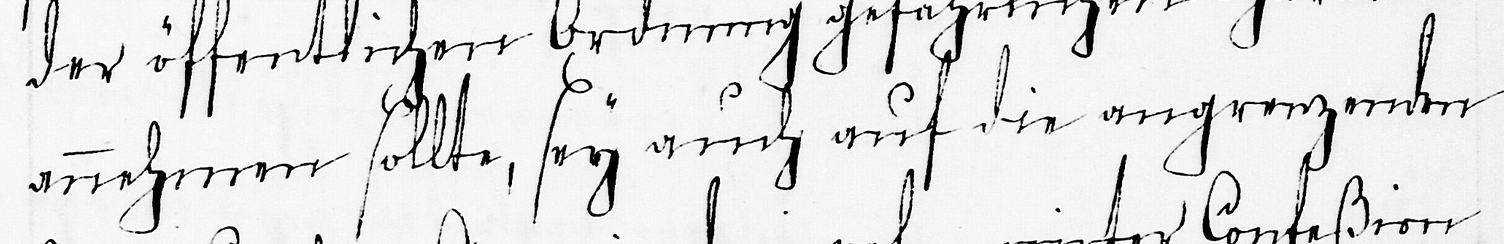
annehmen sollte, sey auch auf die angrenzenden
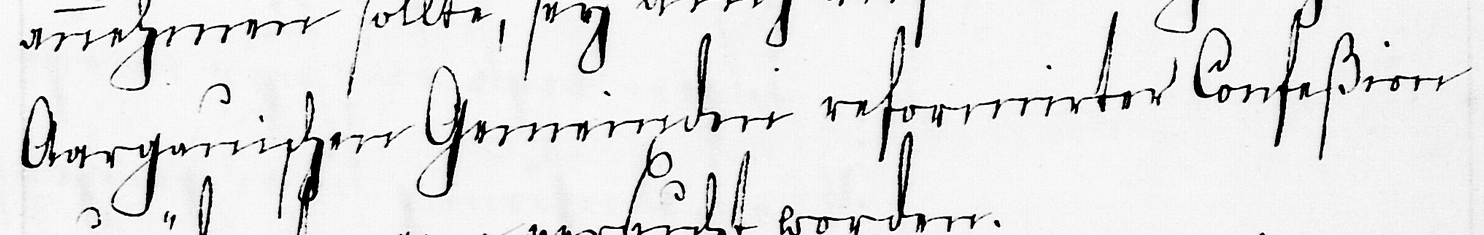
Aargauischen Gemeinden reformirter Confeßion
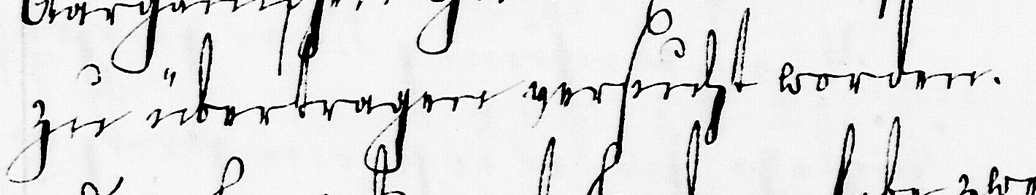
zu übertragen versucht worden.
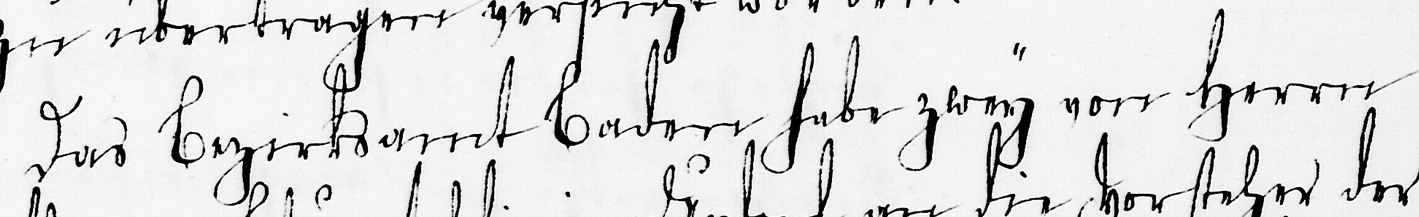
Das Bezirksamt Baden habe zwey von Herrn
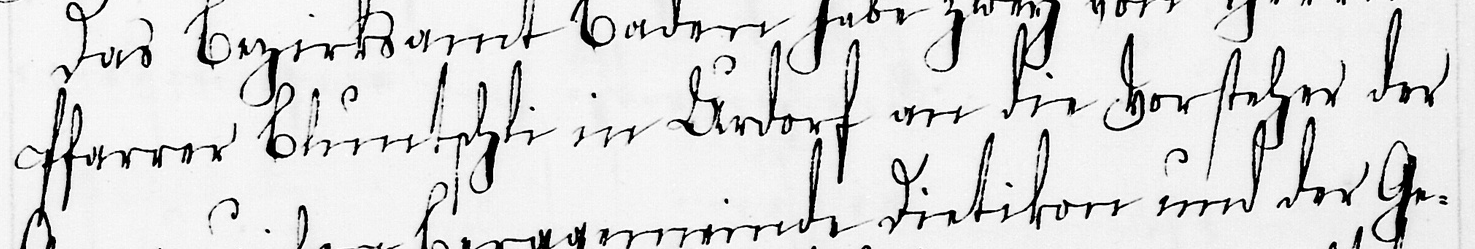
Pfarrer Bluntschli in Urdorf an die Vorsteher der
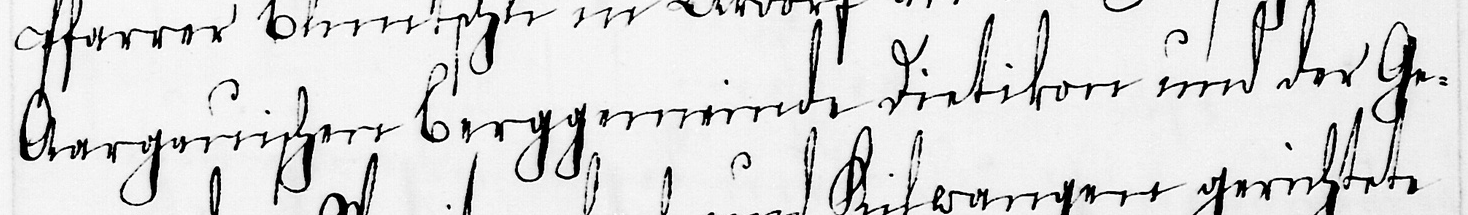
Aargauischen Berggemeinde Dietikon und der Ge¬
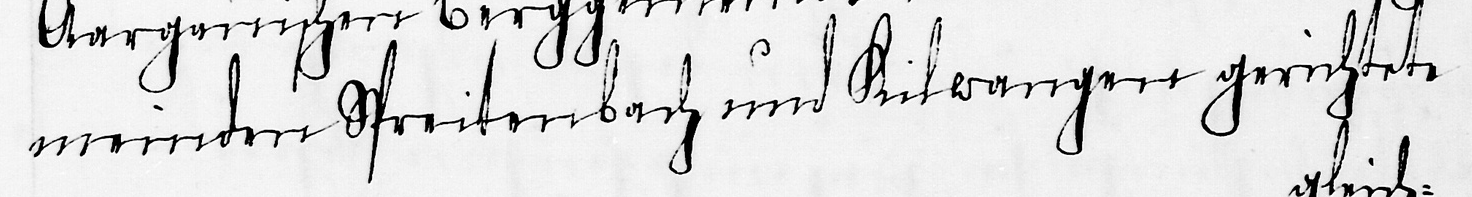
meinden Spreitenbach und Kilwangen gerichtete
